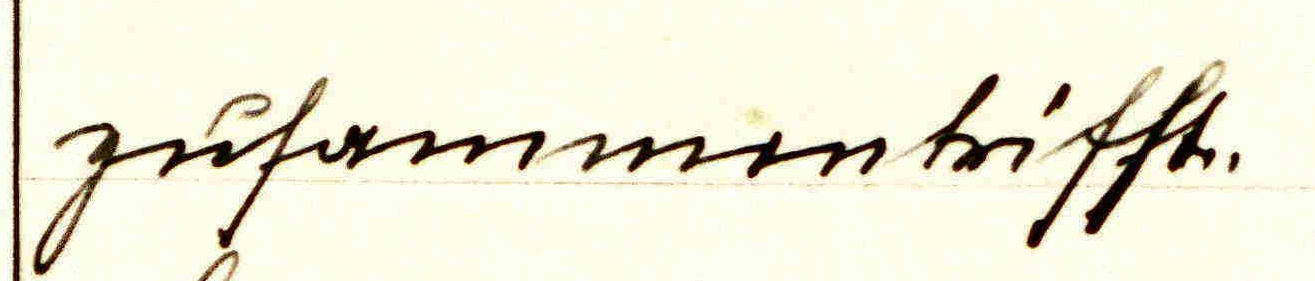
zusammentrifft.
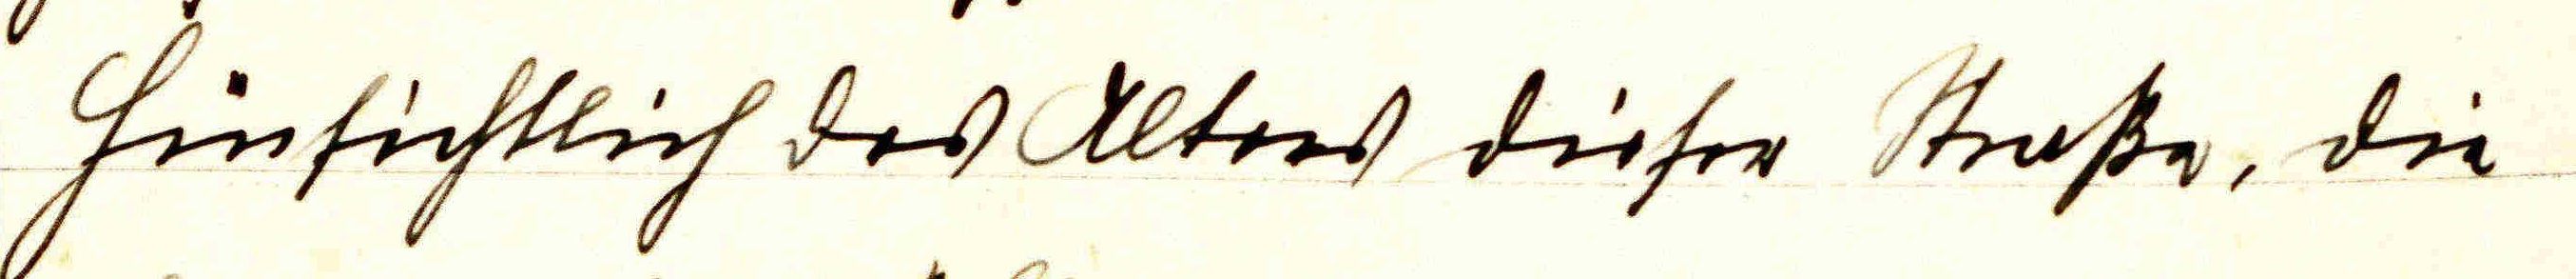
Hinsichtlich des Alters dieser Straße, die
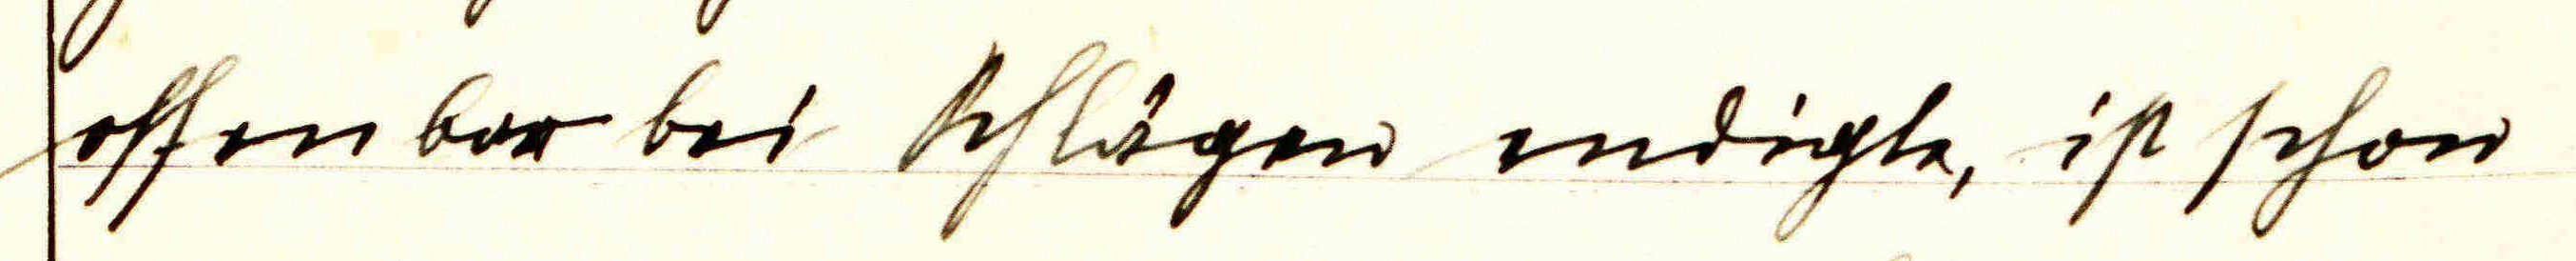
offenbar bei Schlägen endigte, ist schon
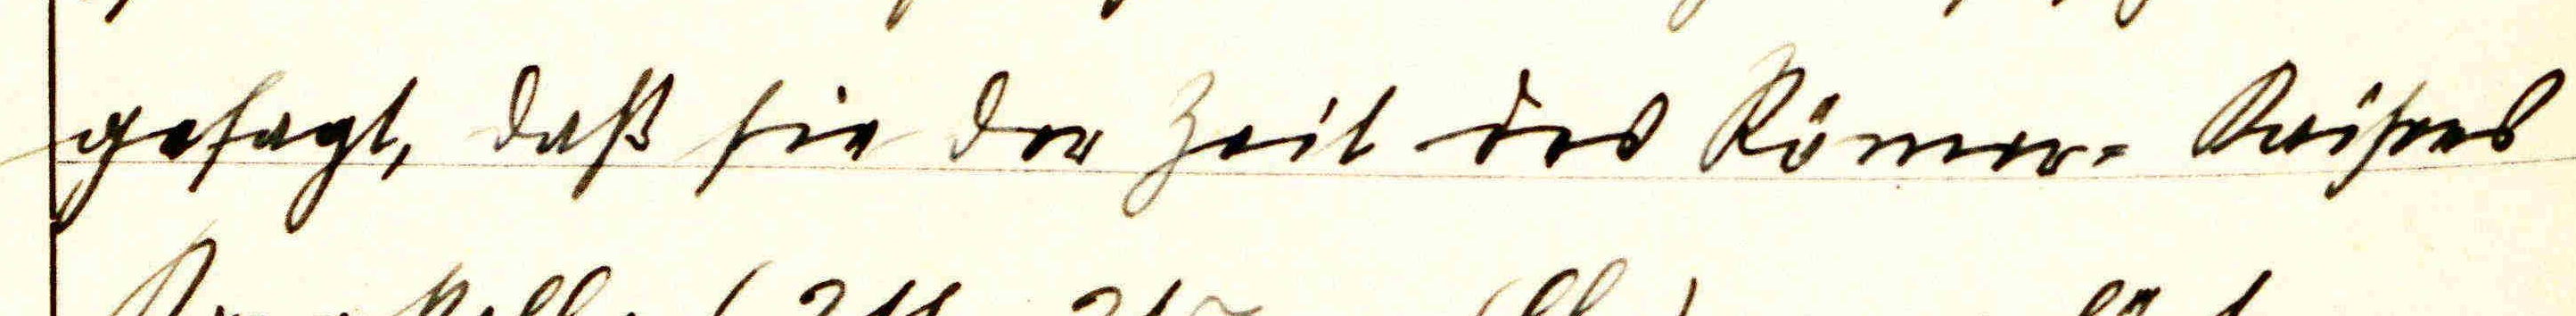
gesagt, daß sie der Zeit des Römers Kaiser
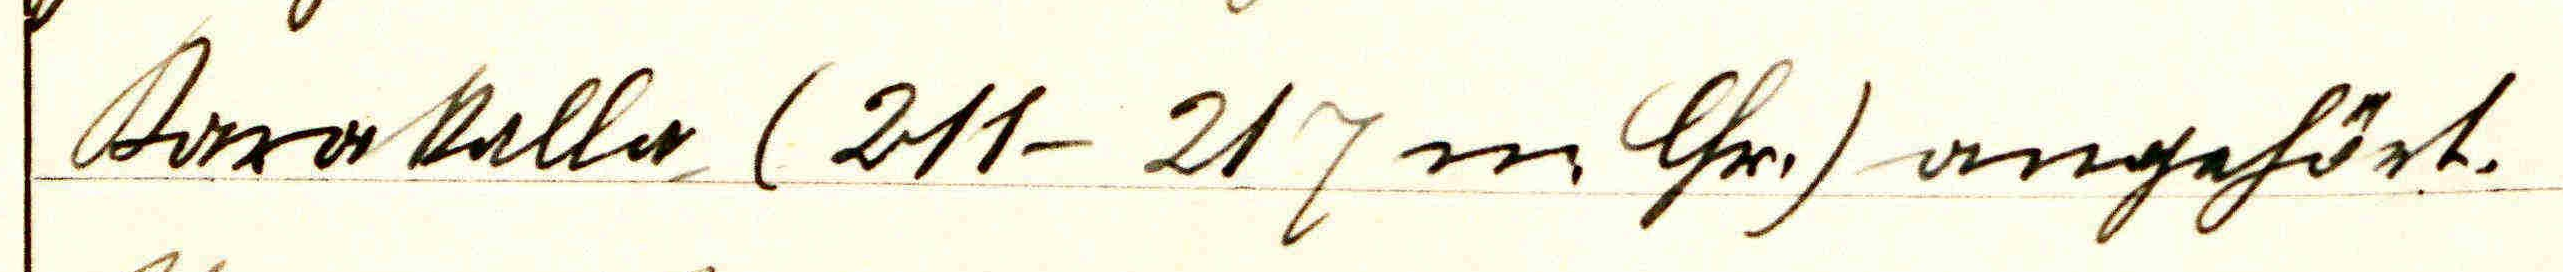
Karakalla (211 -217 n. Chr.) angehört.
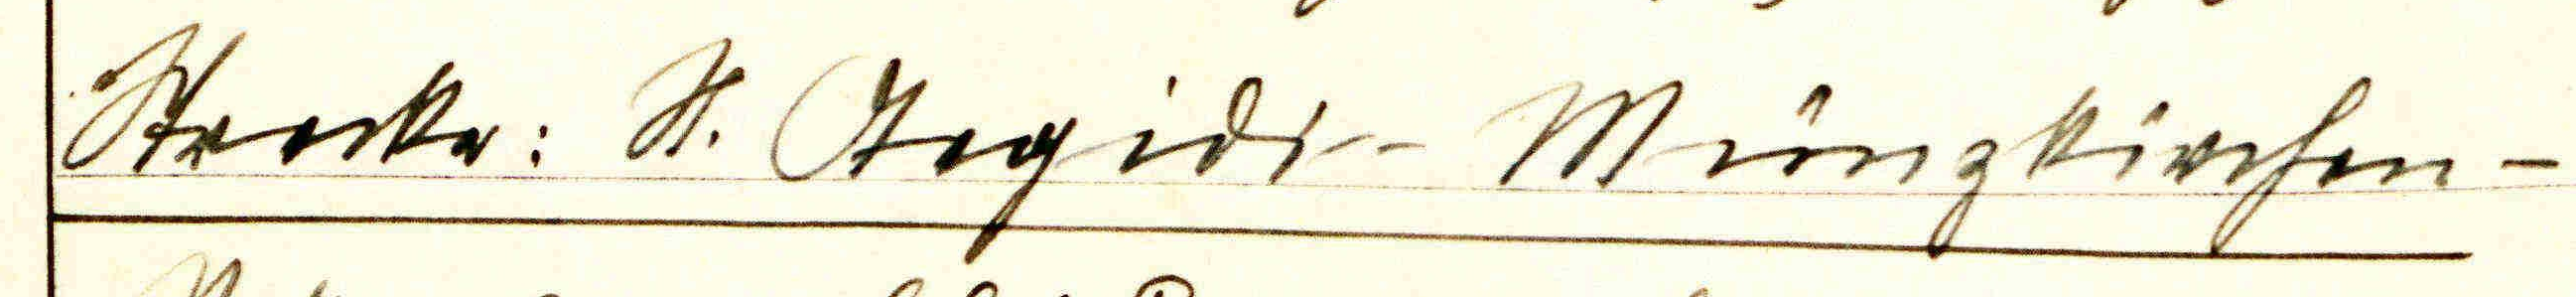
Strecke: St. Ägidi – Münzkirchen –
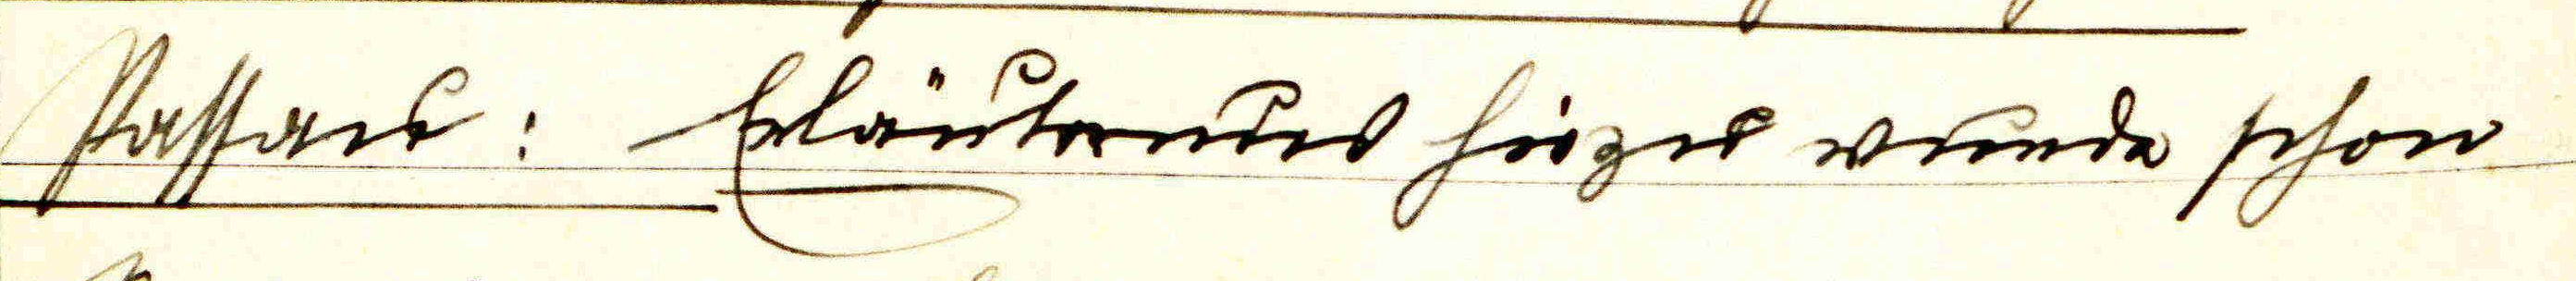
Passau: Erläute??? hiezu wurde schon
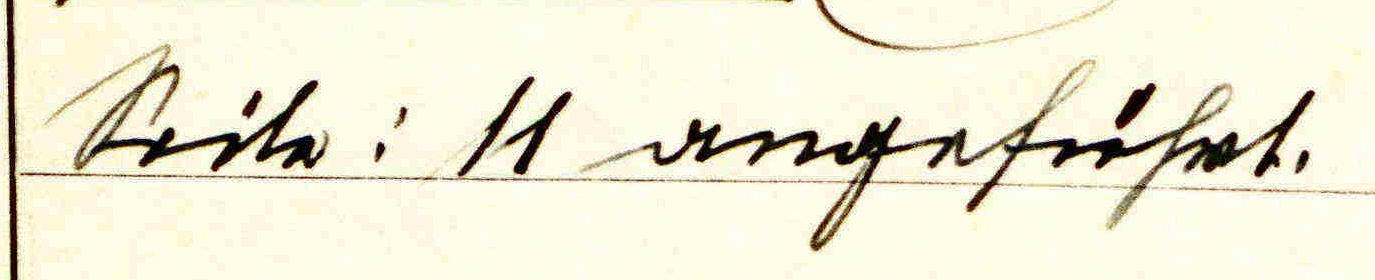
Seite: 11 angeführt.
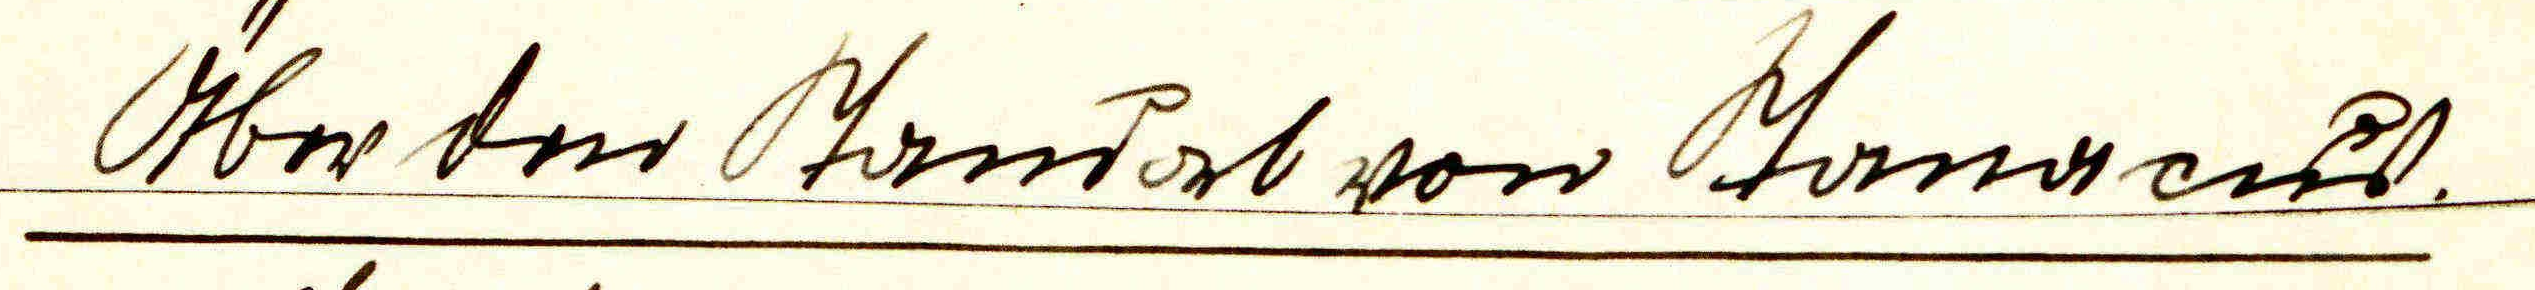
Über den Standort von Stanacus.
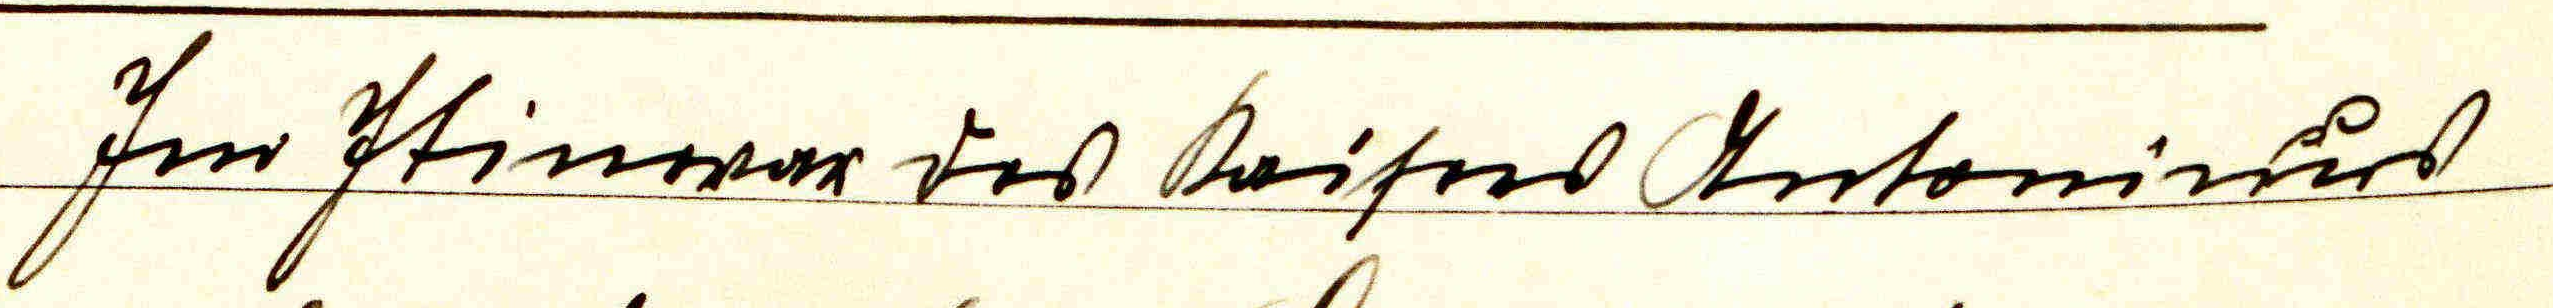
Im Itinerar des Kaisers Anoninus
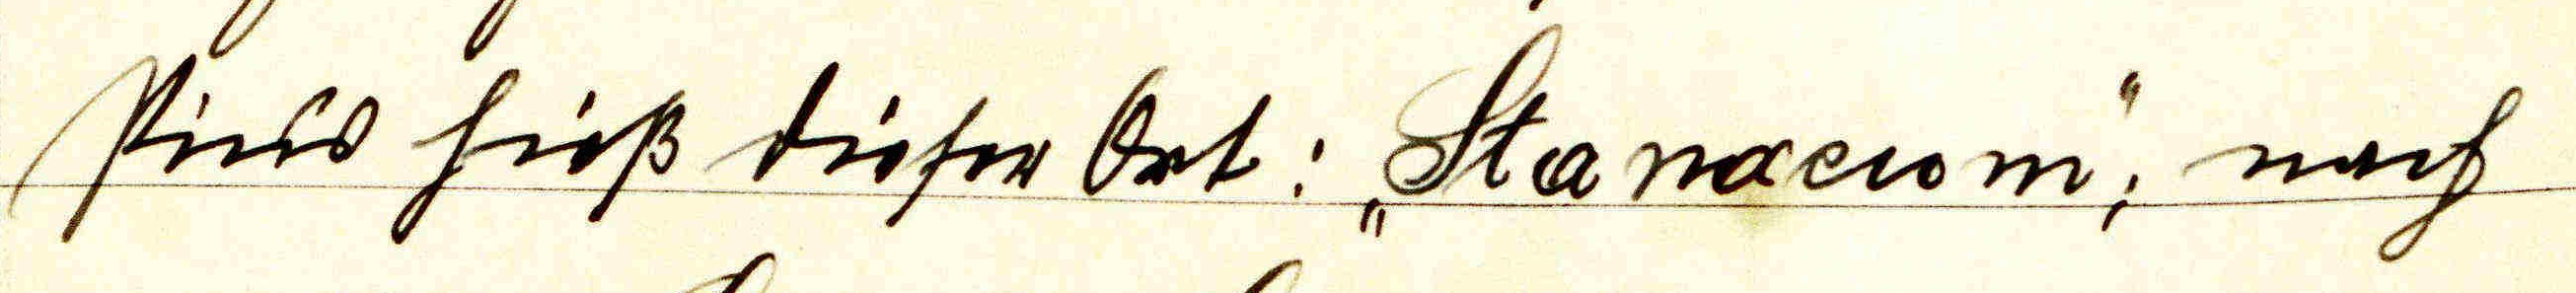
Pius hieß dieser Ort: „Stanacum“; nach
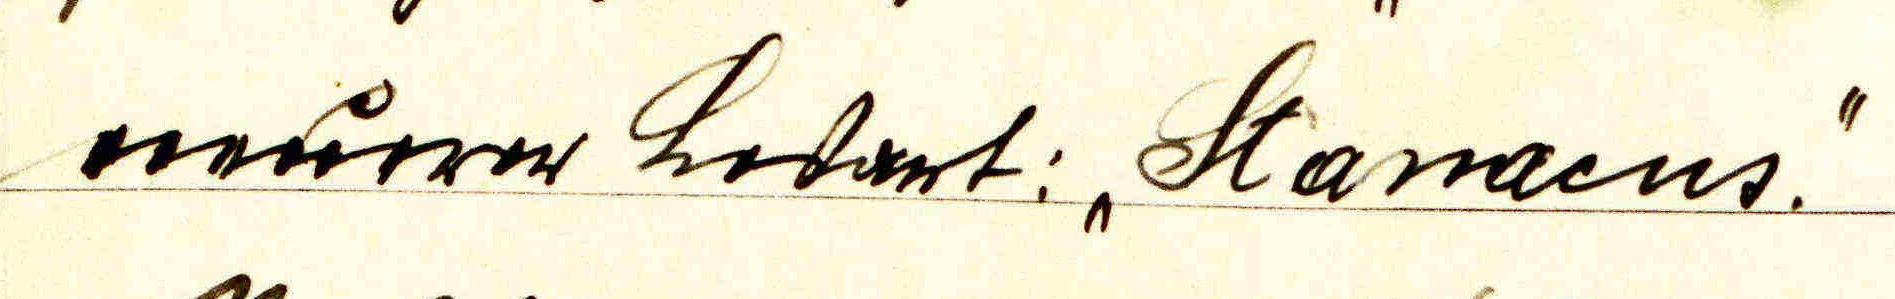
neuerer Lesart: „Stanacus“.
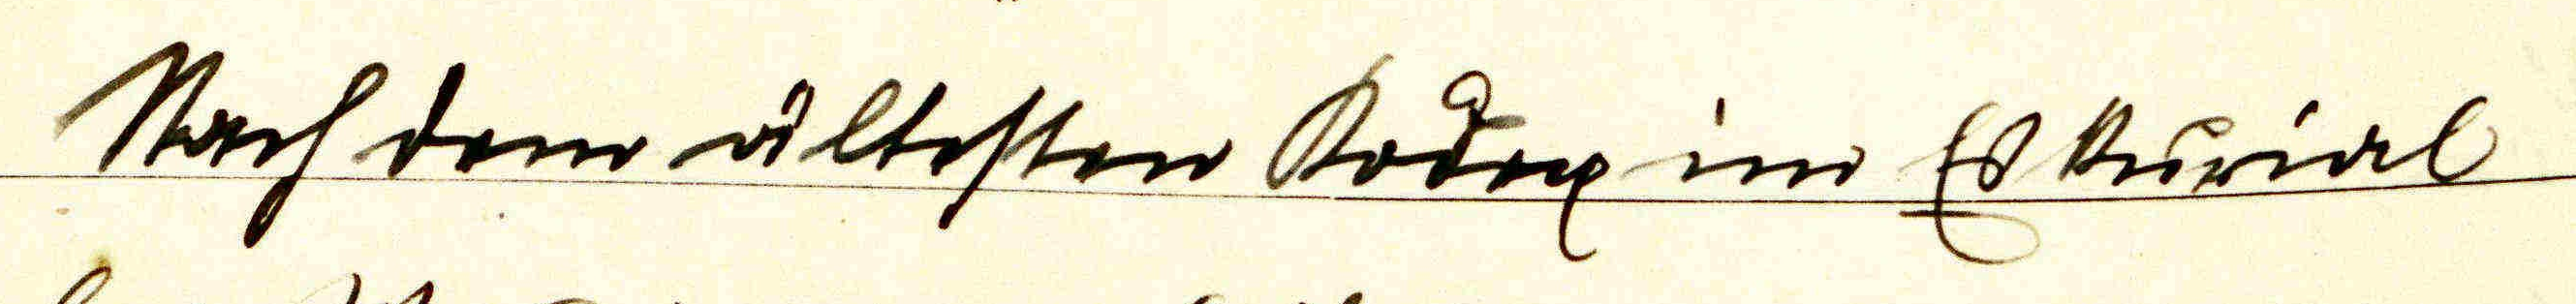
Nach dem ältesten Kodex im Eskurial
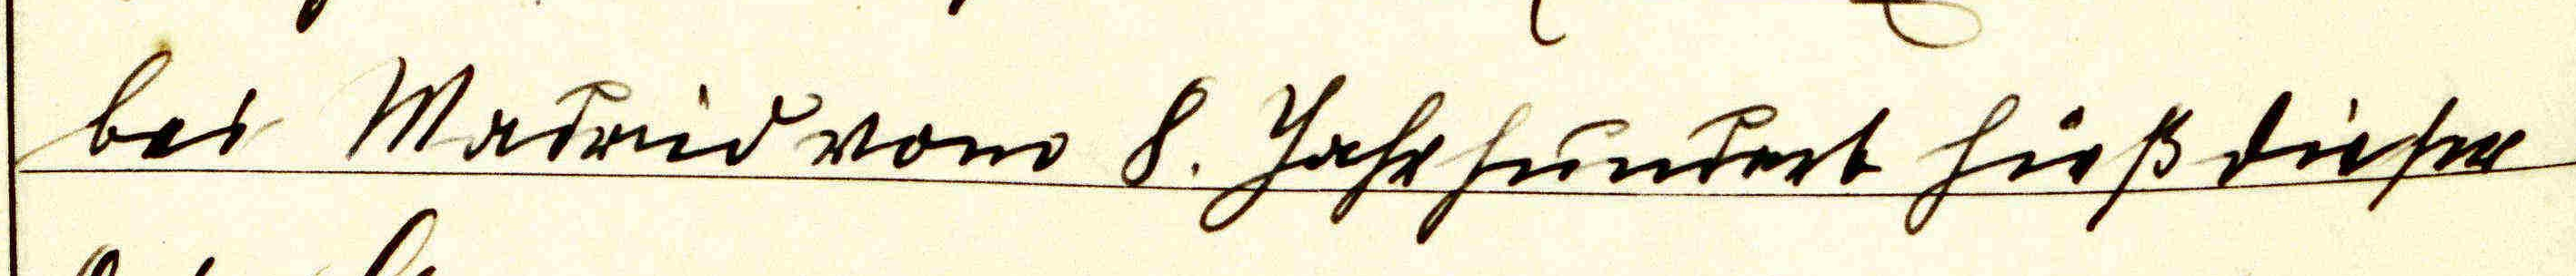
bei Madrid vom 8. Jahrhundert hieß dieser
